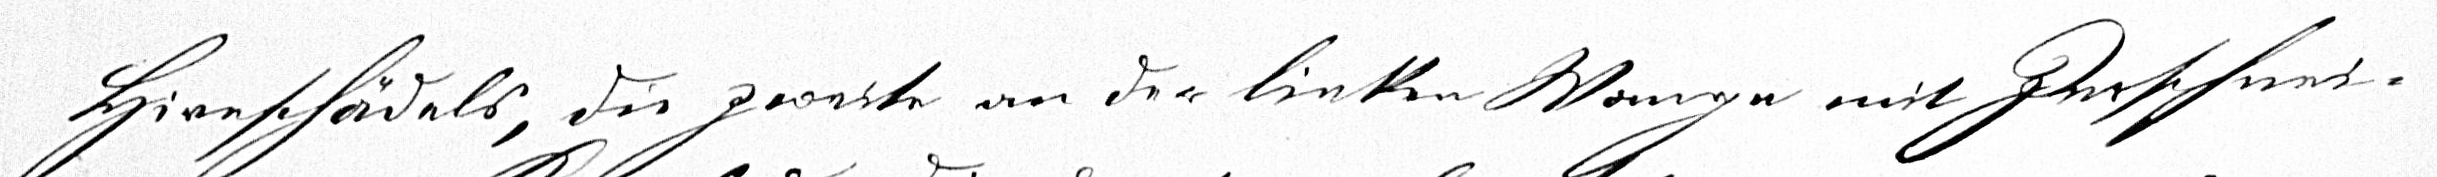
Hirnschädels, die zweite an der linken Wange mit Zerschnei¬
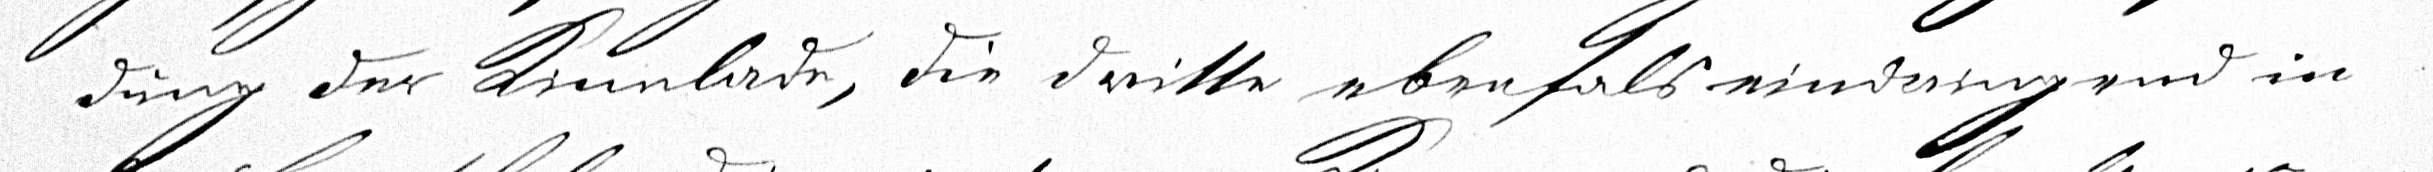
dung der Kinnlade, die dritte ebenfals eindringend in
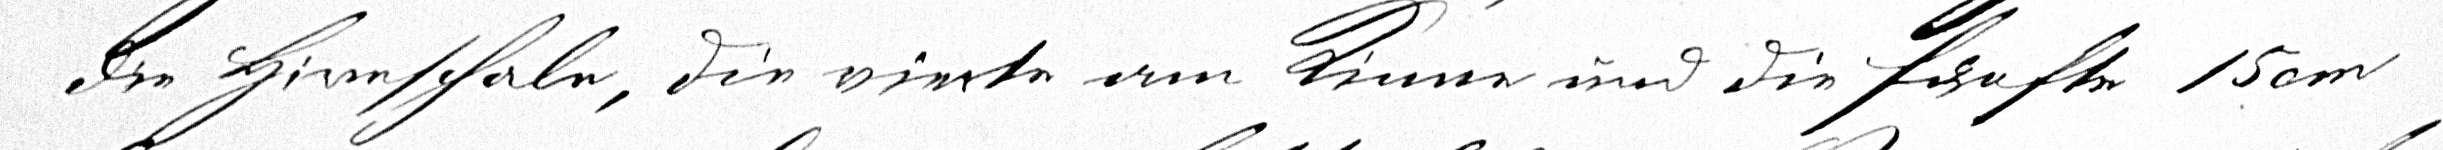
die Hirnschale, die vierte am Kinne und die fünfte 15cm
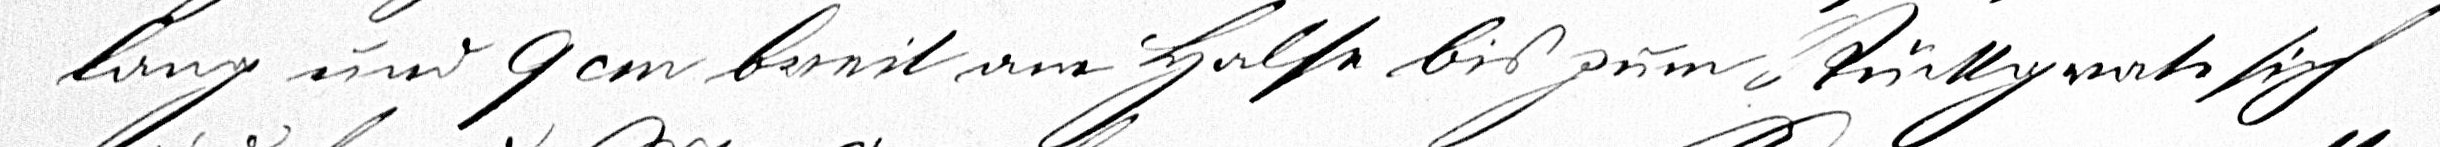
lang und 9cm breit am Halse bis zum Rückgrate sich
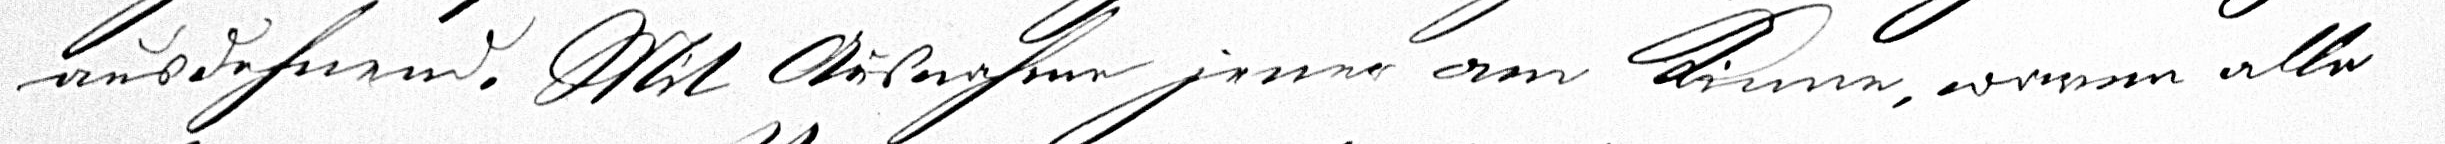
ausdehnend. Mit Ausnahme jener am Kinne, waren alle
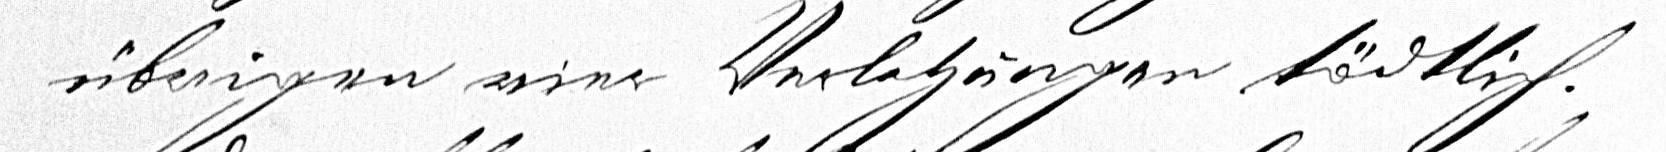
übrigen vier Verletzungen tödtlich.
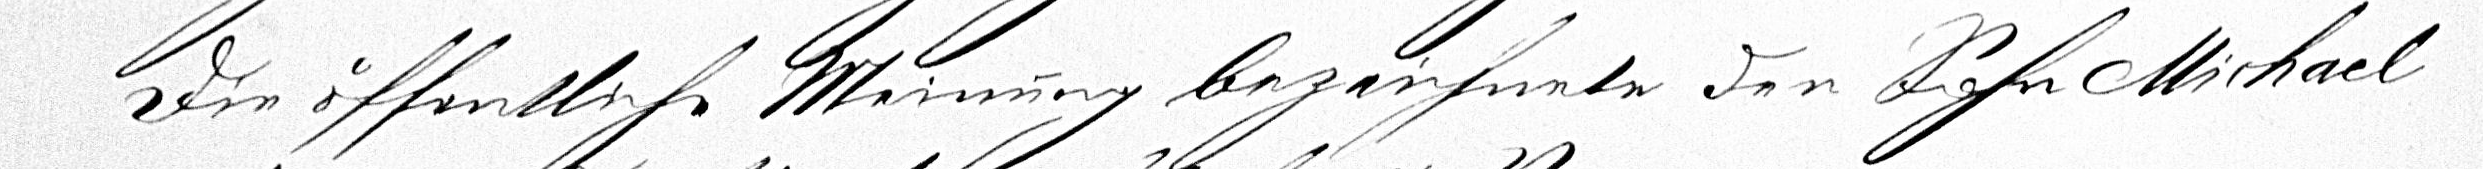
Die öffentliche Meinung bezeichnete den Sohn Michael
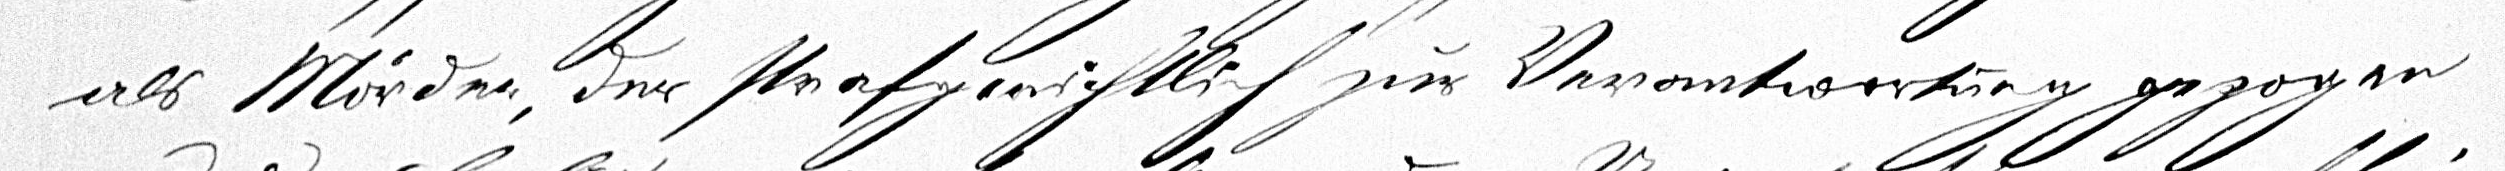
als Mörder, der strafgerichtlich zur Verantwortung gezogen
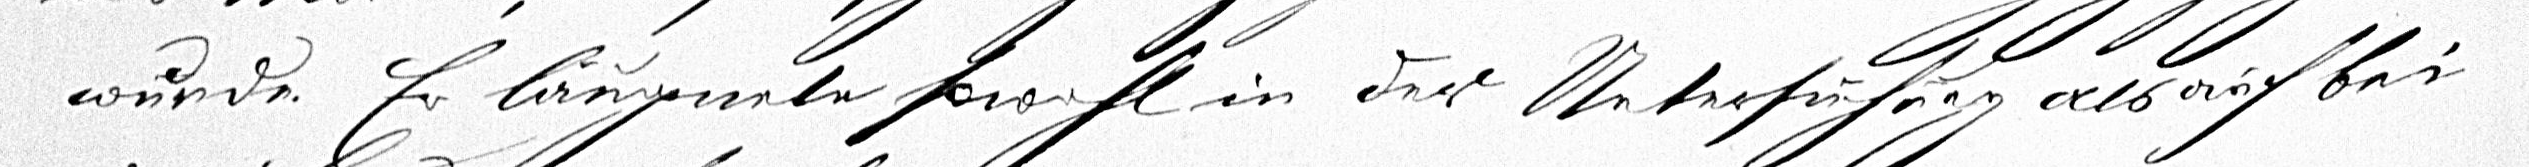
wurde. Er leugnete sowohl in der Untersuchung als auf bei
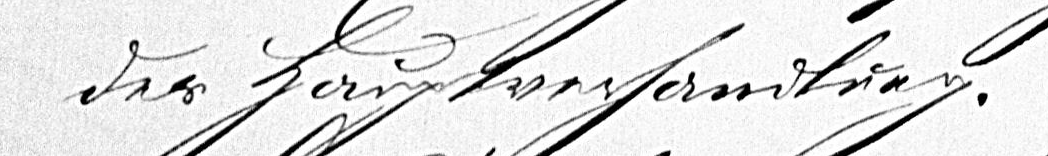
der Hauptverhandlung.
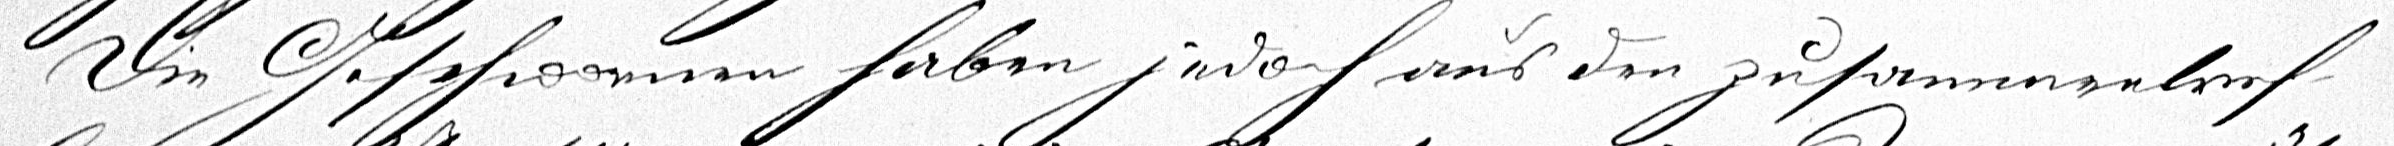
Die Geschwornen haben jedoch aus den zusammentref¬
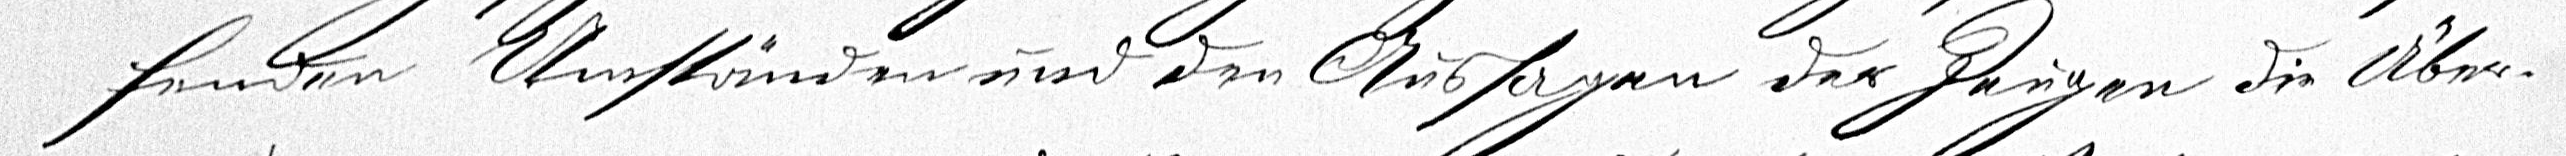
fenden Umständen und den Aussagen der Zeugen die Über¬
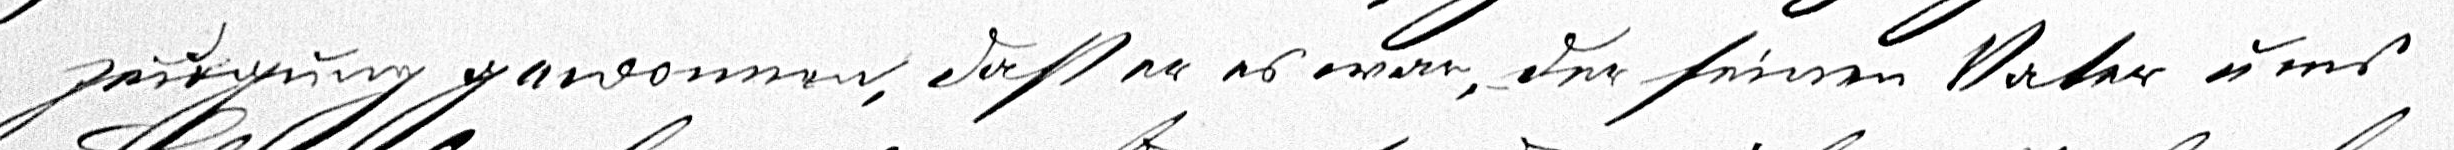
zeugung gewonnen, daß er es war, der seinen Vater ums
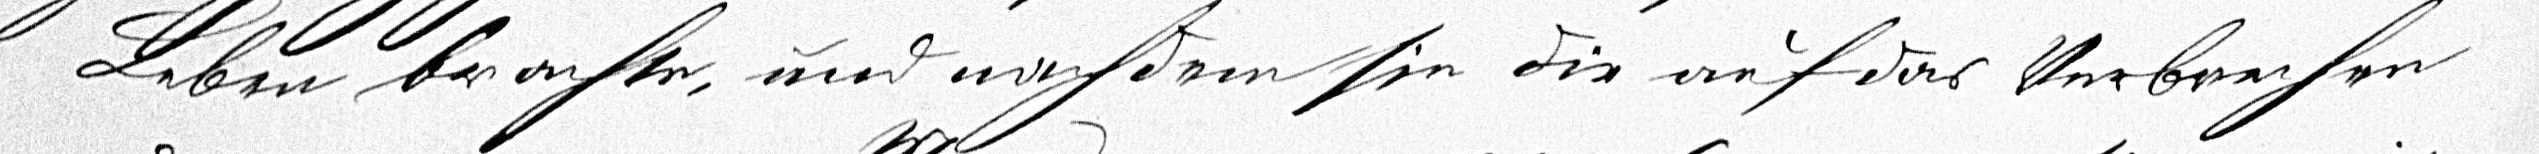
Leben brachte, und nachdem sie die auf das Verbrechen
